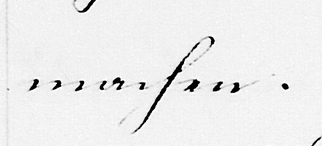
machen.
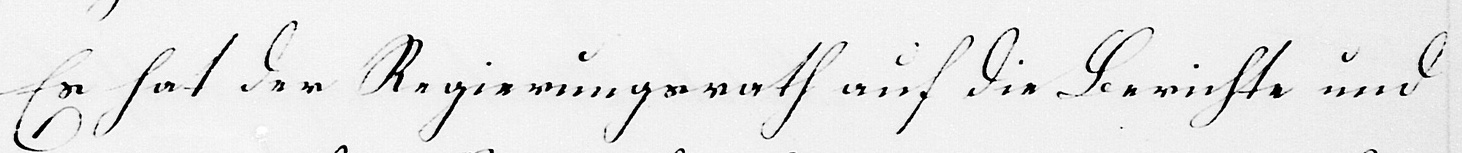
Es hat der Regierungsrath auf die Berichte und
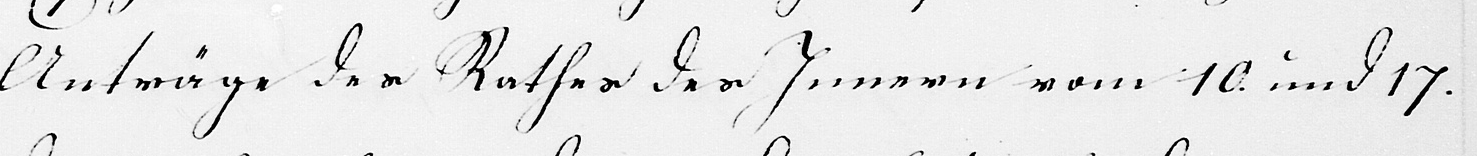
Anträge des Rathes des Innern vom 10. und 17.
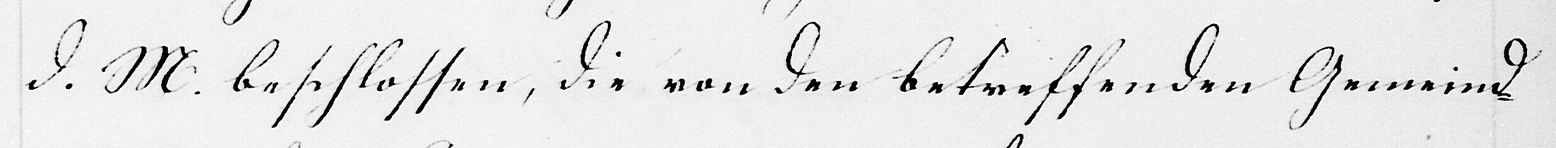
d. M. beschlossen, die von den betreffenden Gemeind¬
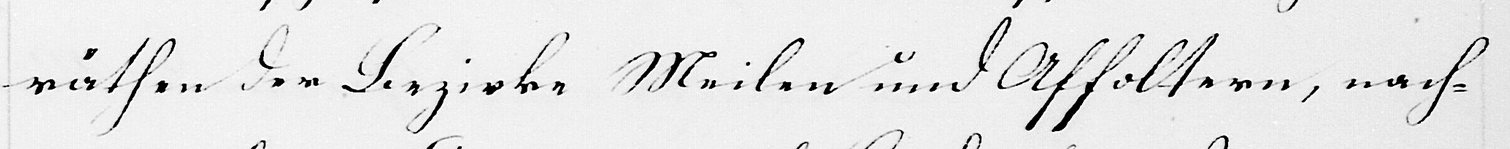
räthen der Bezirke Meilen und Affoltern, nach¬
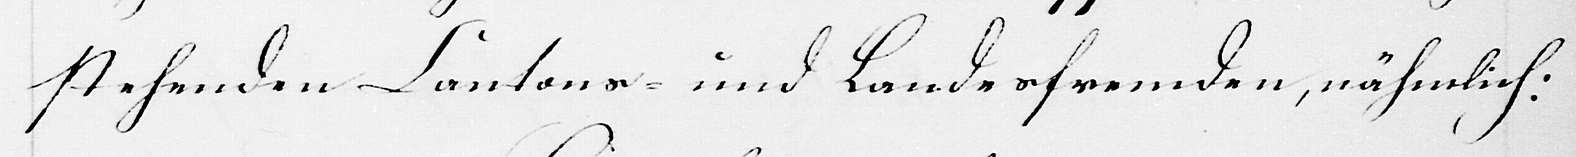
stehenden Cantons- und Landesfremden, nähmlich:
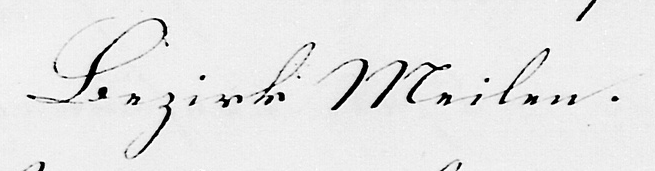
Bezirk Meilen.
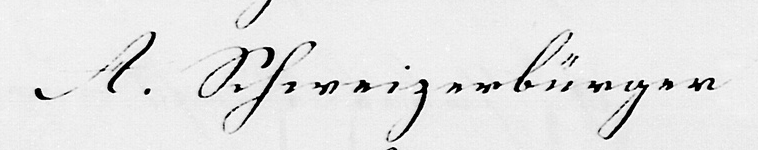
A. Schweizerbürger
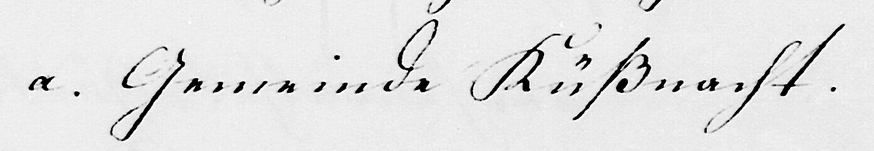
a. Gemeinde Küßnacht.
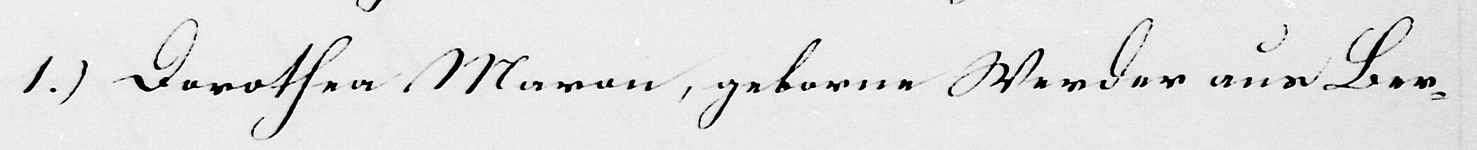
1.) Dorothea Maron, geborne Werder aus Ber-
